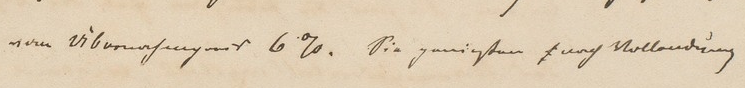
vom Überahmezins 6%. Sie genießen nach Vollendung
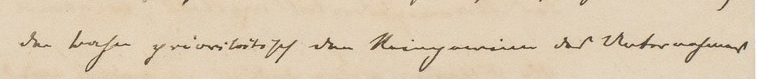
der Bahn prioritätisch den Reingewinn des Unternehmens
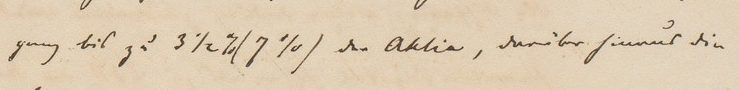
ganz bis zu 3½% (7%) der Aktie, darüber hinaus die
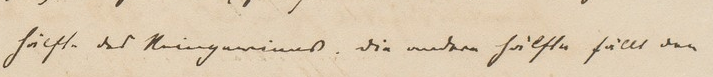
Hälfte der Reingewinns. Die andere Hälfte fällt den
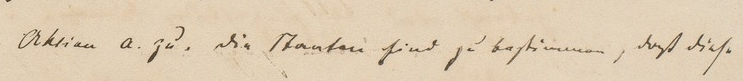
Aktien a. zu. Die Staaten sind zu bestimmen, daß diese
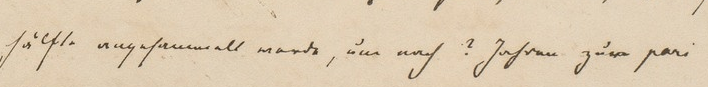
Hälfte angesammelt werde, um nach ... Jahren zur pari
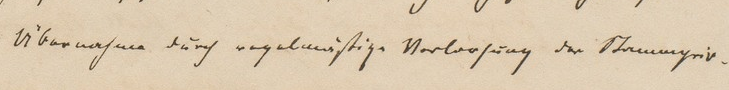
Übernahme durch regelmäßige Verloosung der Stammprio-
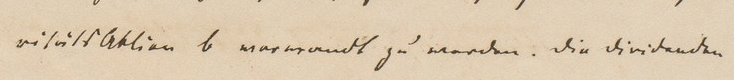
ritätsAktien b verwandt zu werden. Die Dividenden
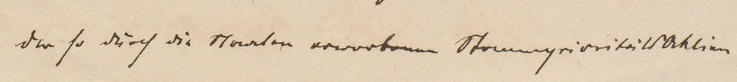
der so durch die Staaten erworbenen StammprioritätsAktien
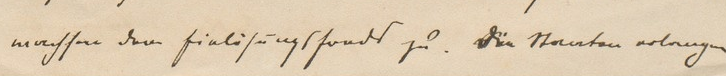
wachsen dem Einlösungsfonds zu. Die Staaten erlangen
